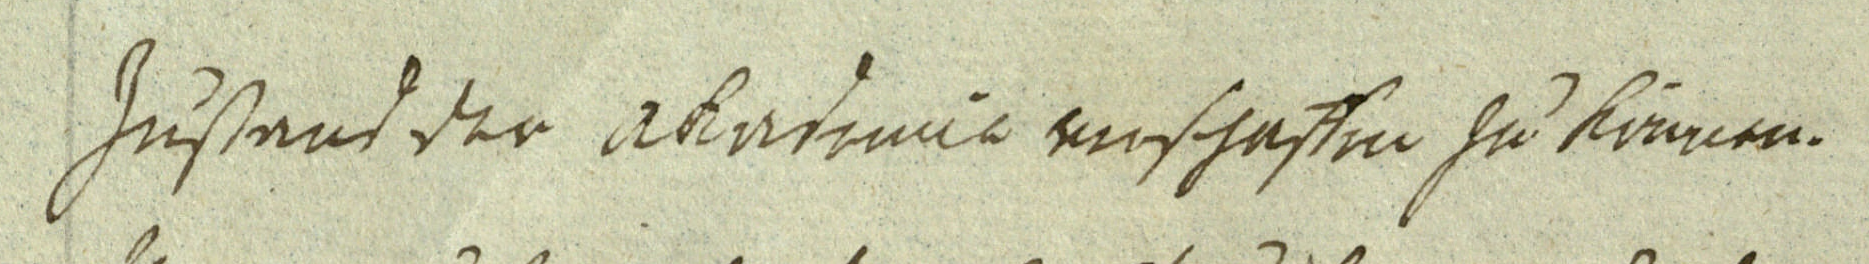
Zustand der Akademie verschaffen zu können.
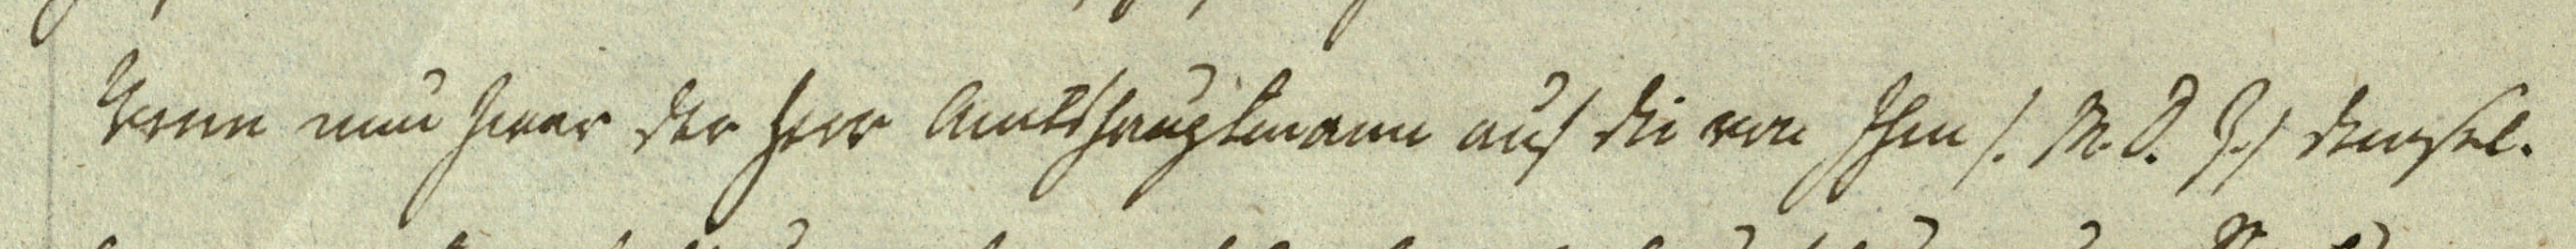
Wenn nun zwar der Herr Amtshauptmann auf die von Ihm / M. D. R./ demsel¬
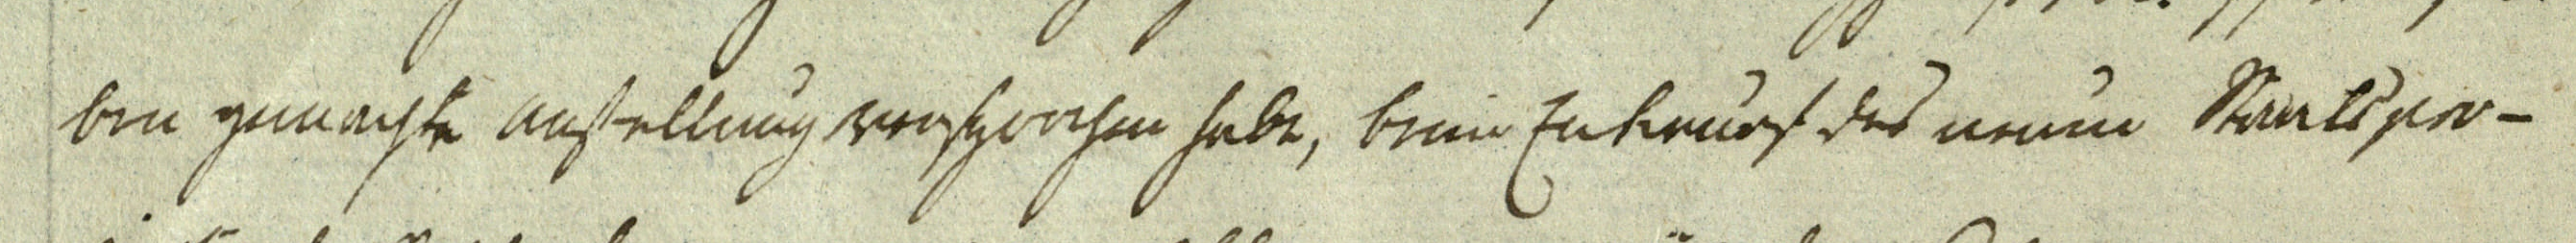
ben gemachte Anstellung versprochen habe, beim Entwurf des neuen Staatspro¬
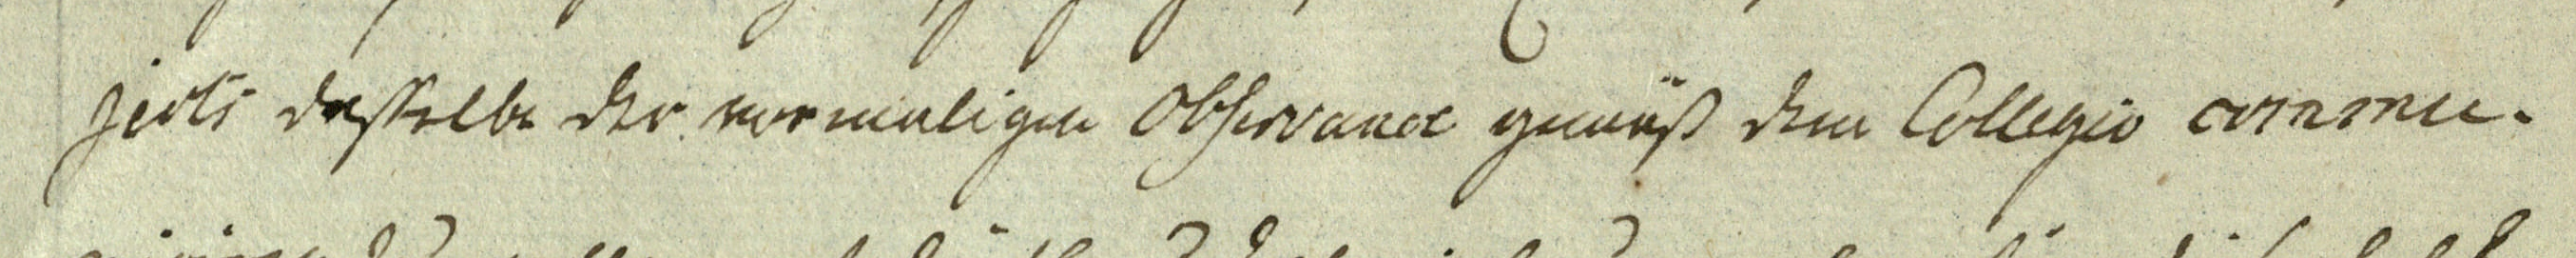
jects dasselbe der vormaligen Observance gemäß dem Collegio commu¬
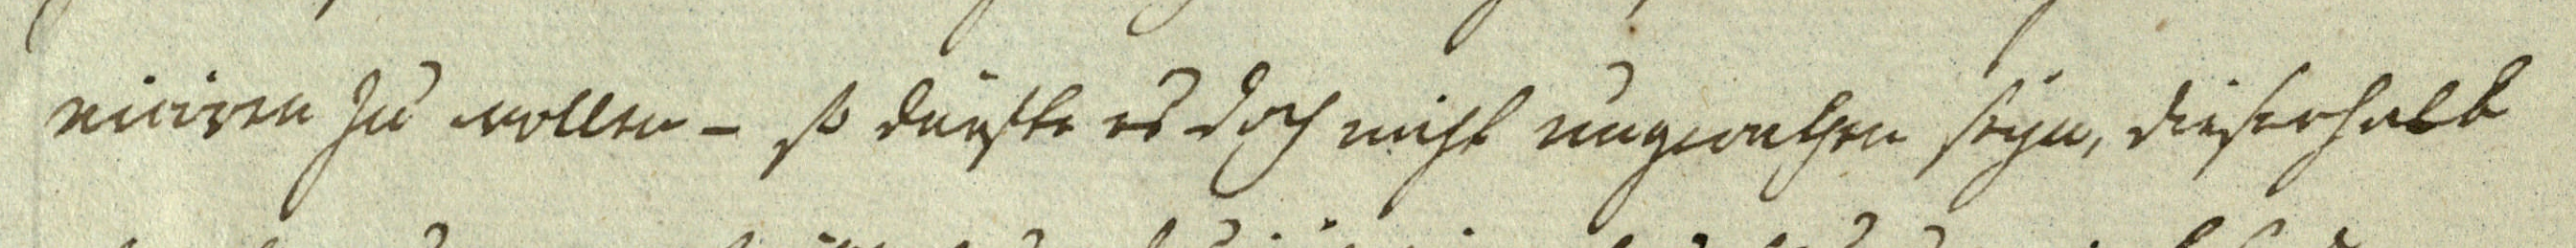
niciren zu wollen - so dürfte es doch nicht angerathen seÿn, dieserhalb
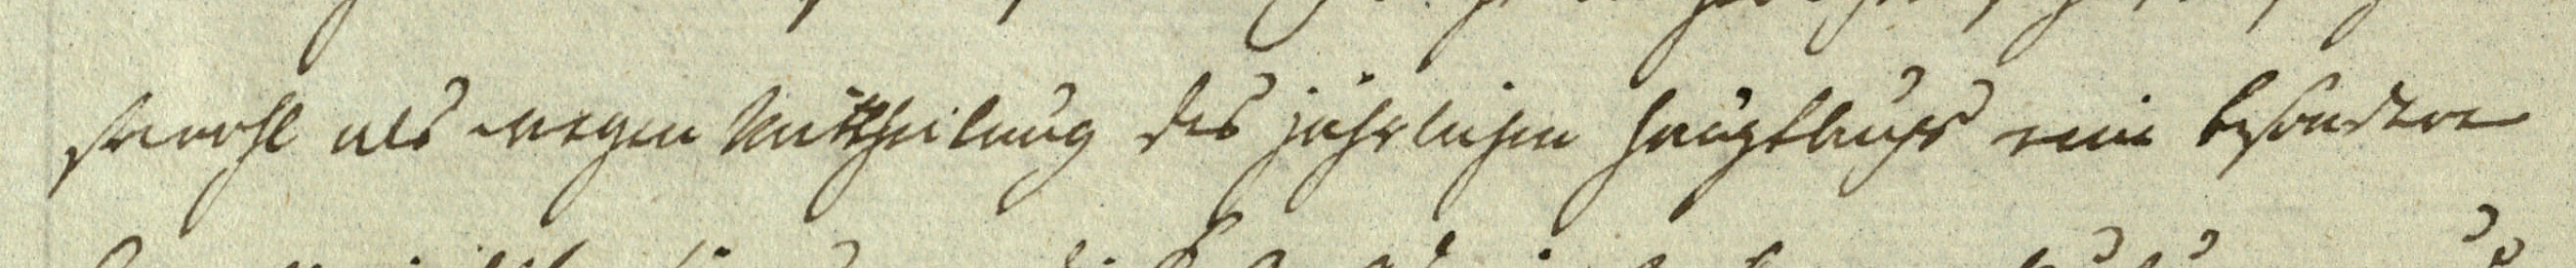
sowohl als wegen Mittheilung des jährlichen Hauptbuchs eine besondere
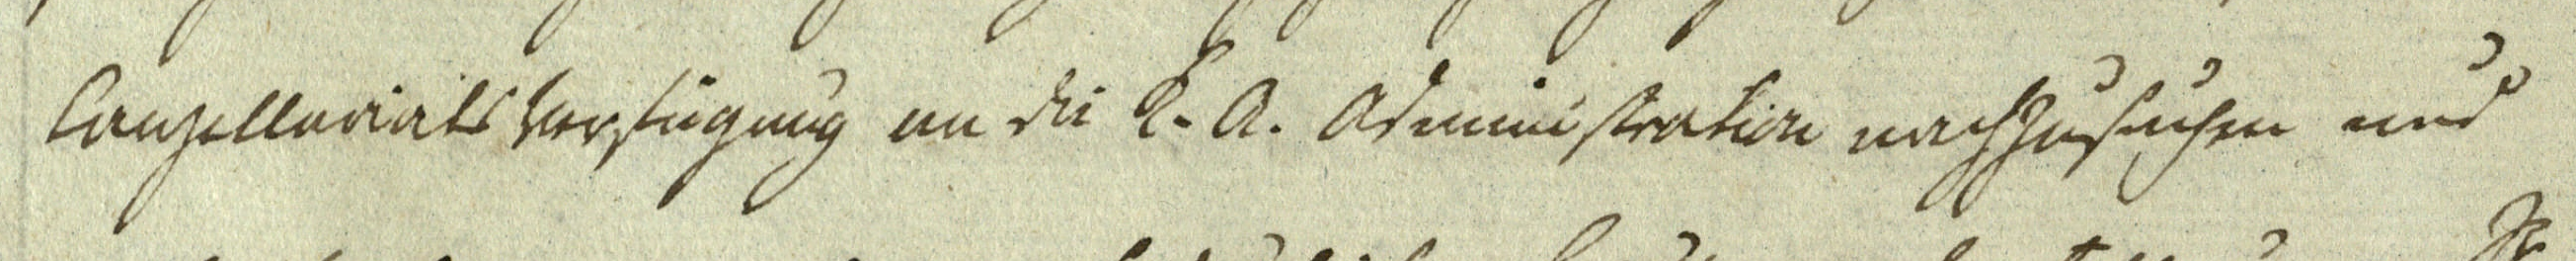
Canzellariats Verfügung an die K. A. Administration nachzusuchen und
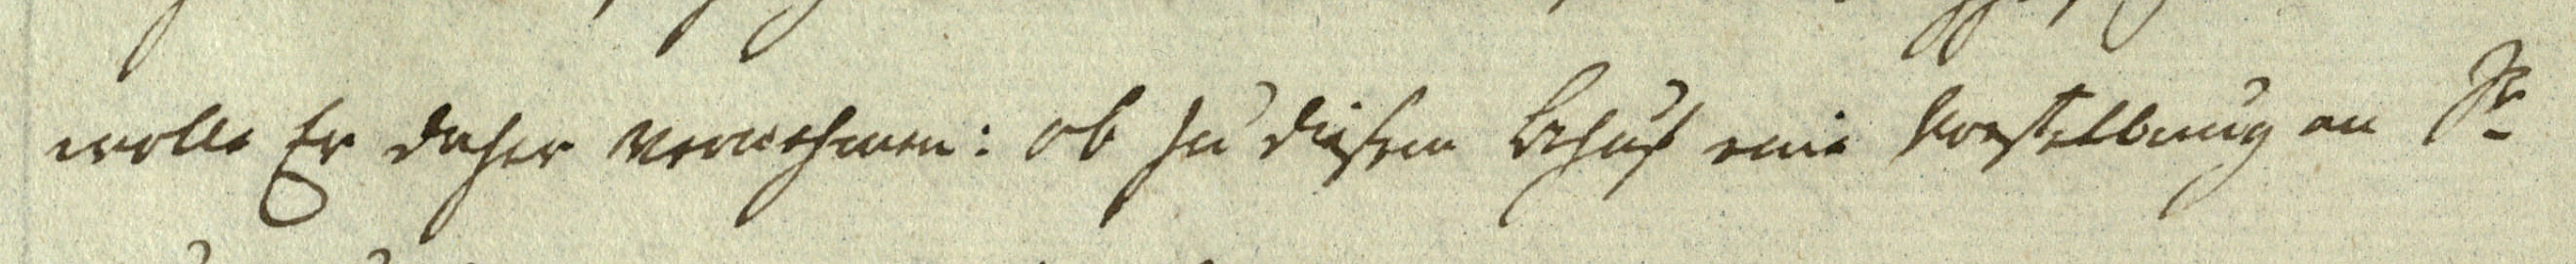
wolle Er daher vernehmen: ob zu diesem Behuf eine Vorstellung an Sr.
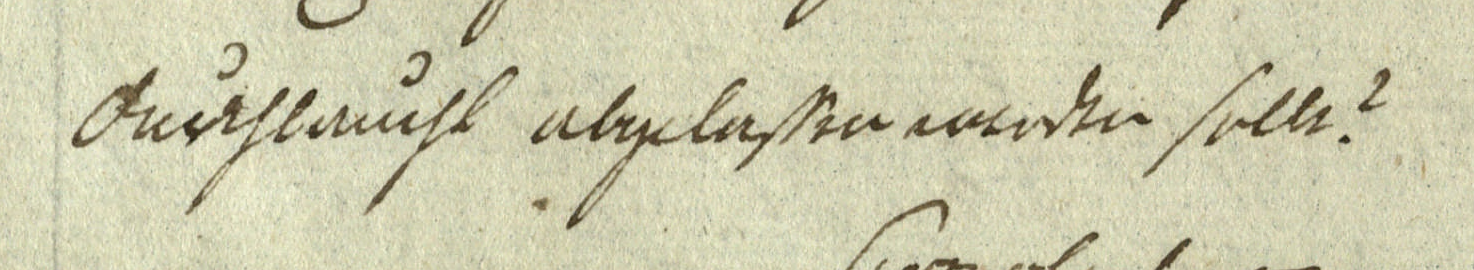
Durchlaucht abgelassen werden solle?
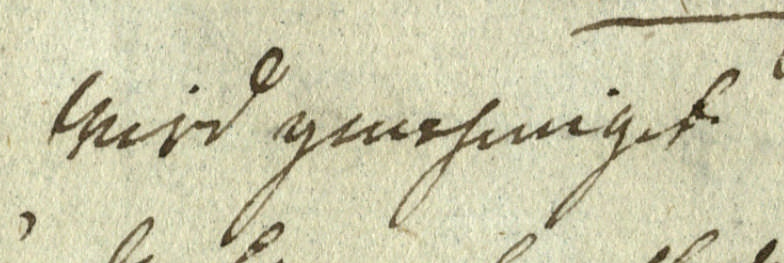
Wird genehmiget
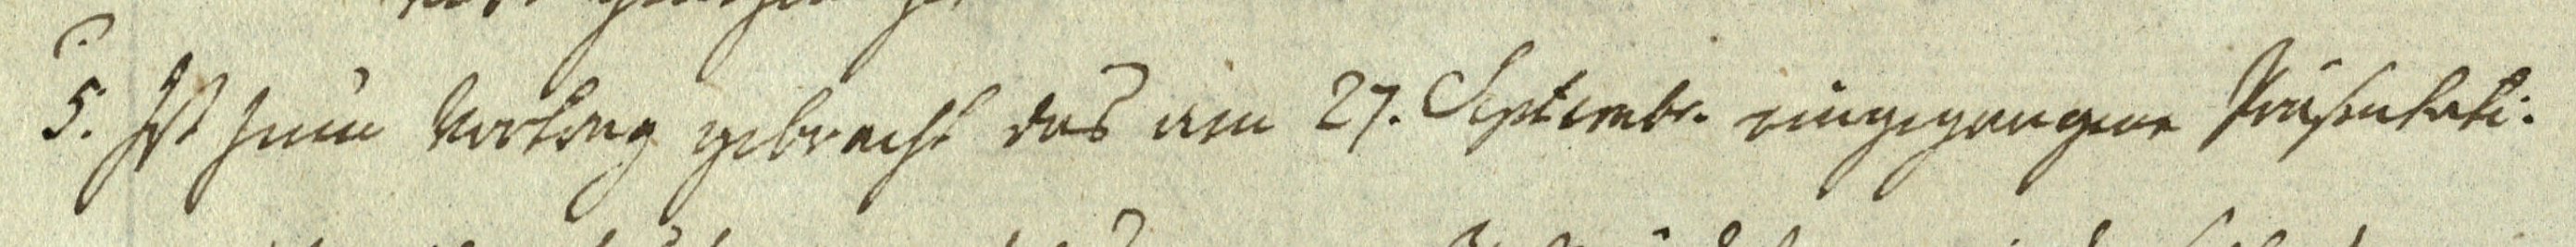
5. Ist zum Vortrag gebracht das am 27. Septembr eingegangene Präsentati¬
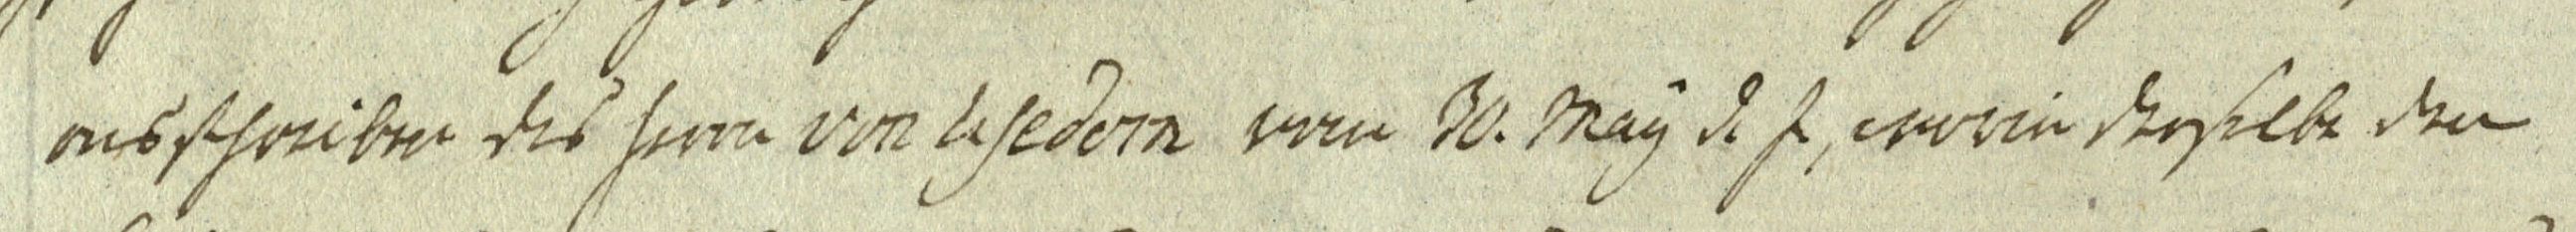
onsschreiben des Herrn von Usedom vom 30. Maÿ d. J., worin derselbe den
